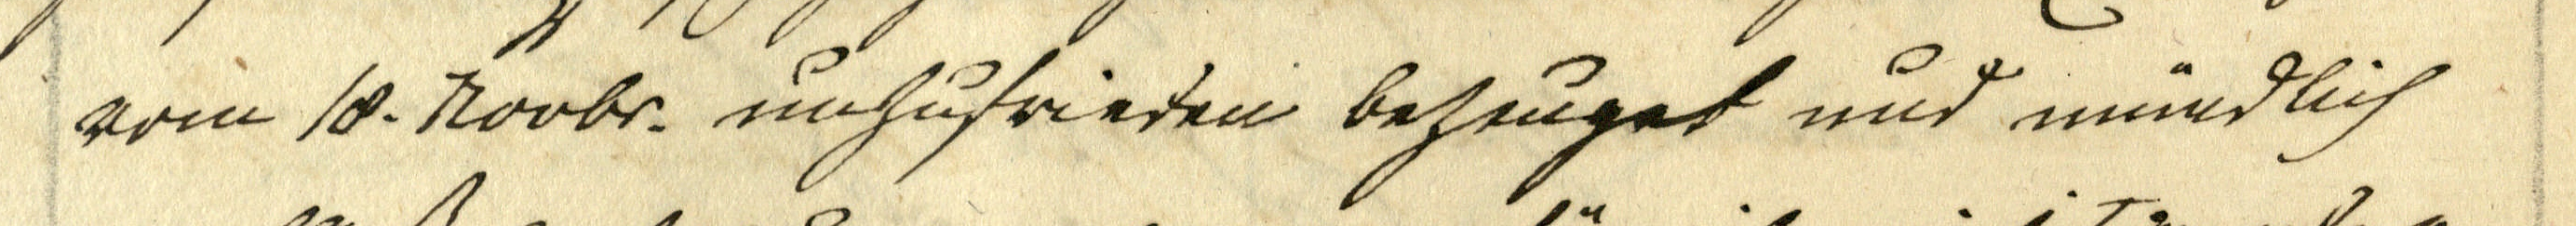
vom 18. Novbr. zufrieden bezeuget und mündlich
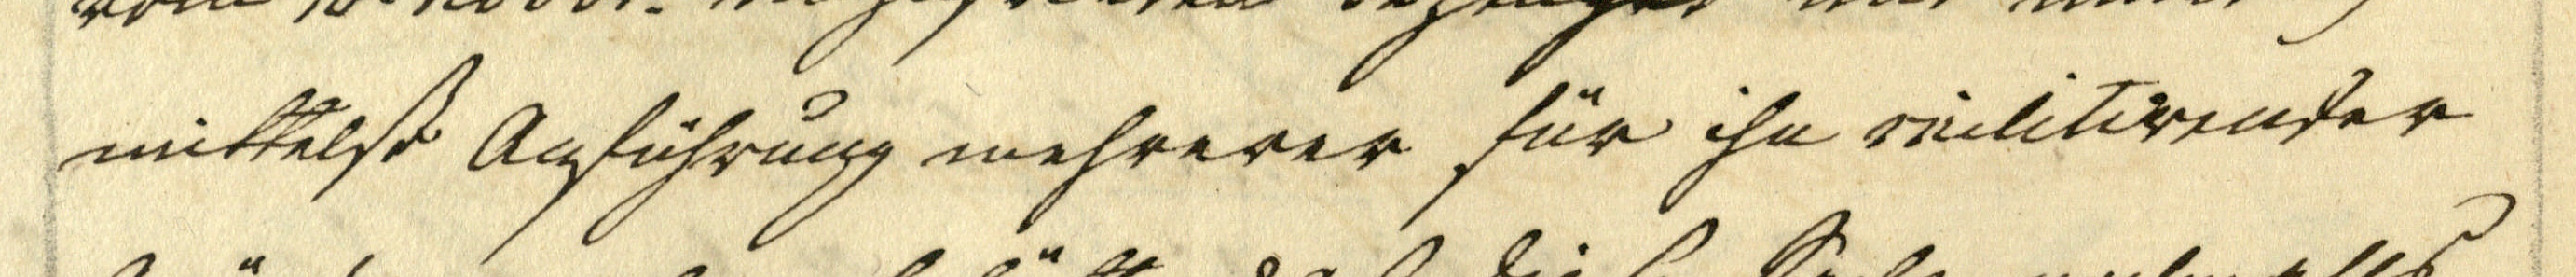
mittelst Anführung mehrerer für ihn militirender
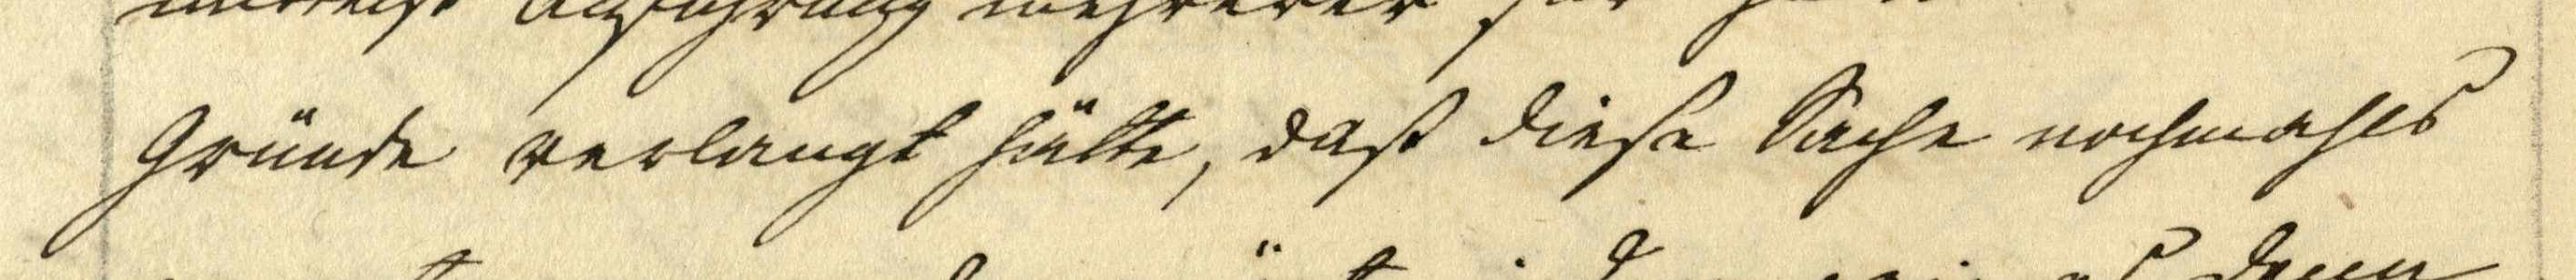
Gründe verlangt hätte, daß diese Sache nochmahls
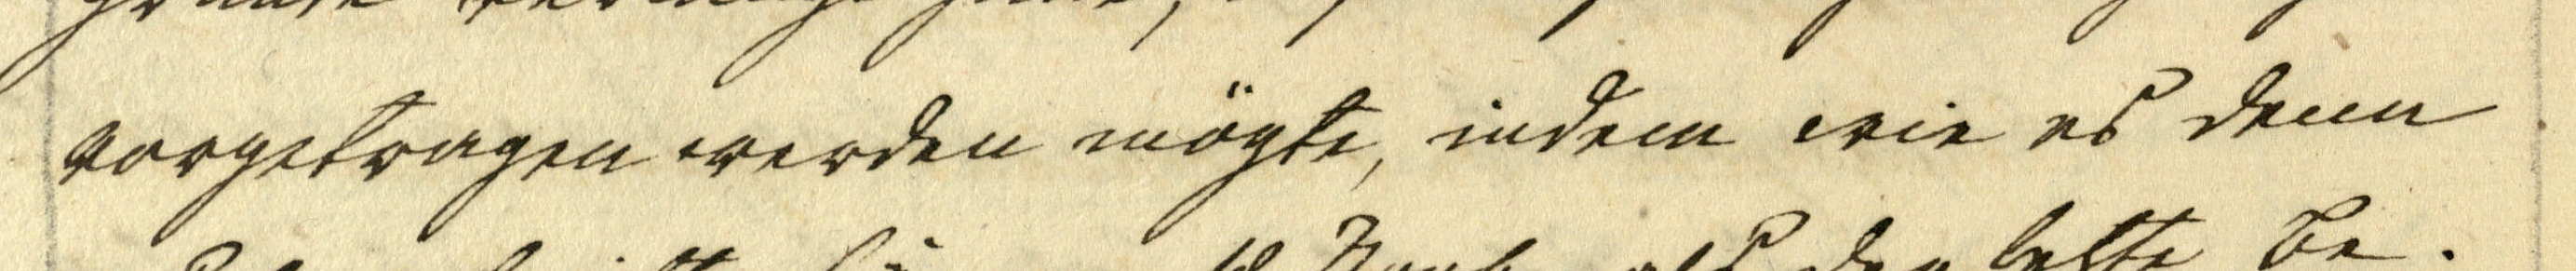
vorgetragen werden mögte, indem wie es denn
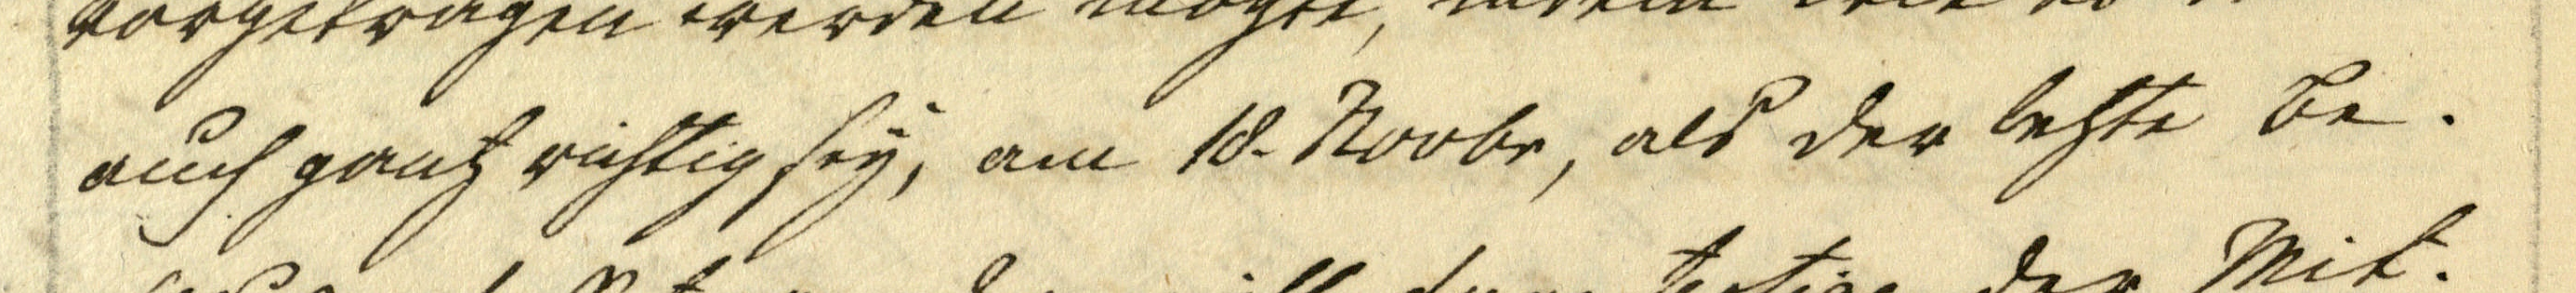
auch gantz richtig seÿ, am 18. Novbr, als der letzte Be¬
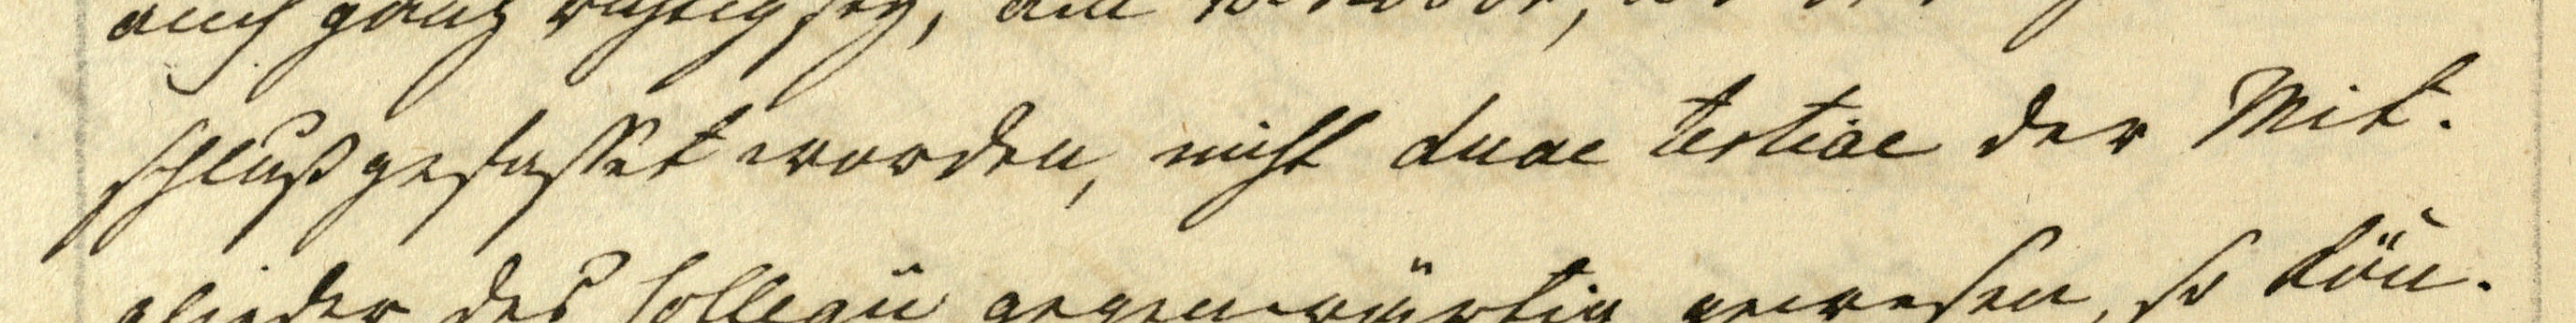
schluß gefasset worden, nicht duae tertiae der Mit¬
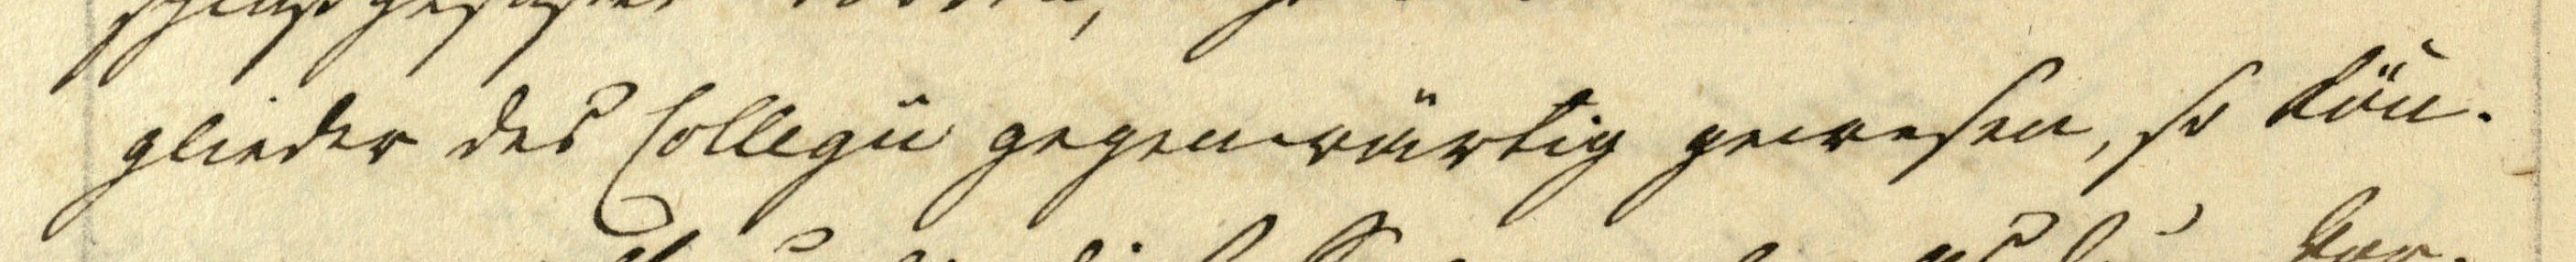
glieder des Collegii gegenwärtig gewesen, so kön¬
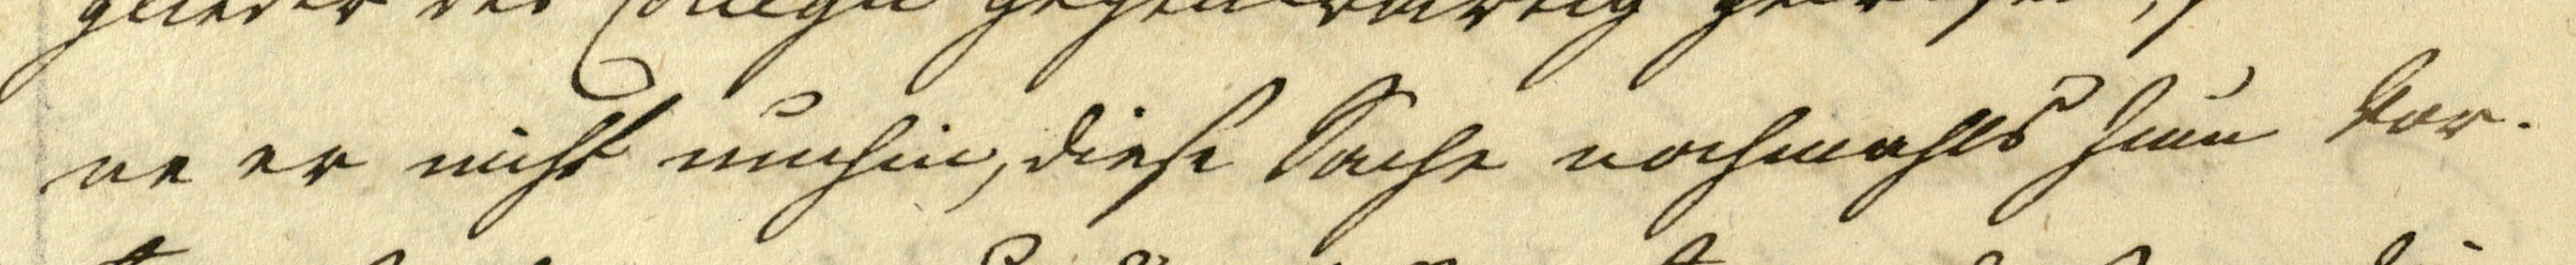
ne er nicht umhin, diese Sache nochmahls zum Vor¬
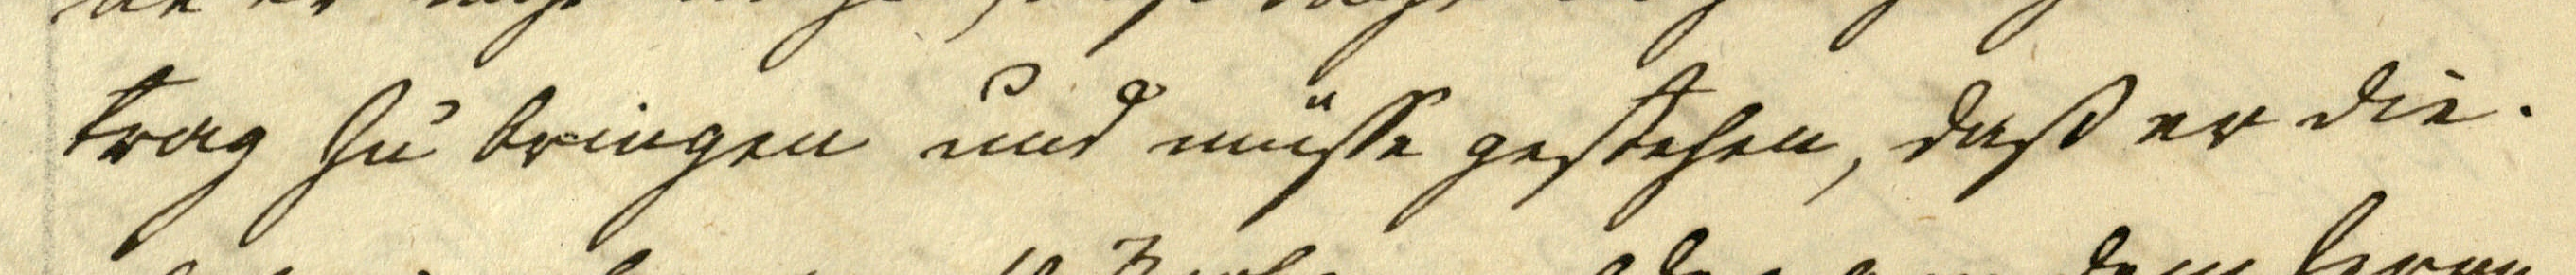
trag zu bringen und müsse gestehen, daß er die¬
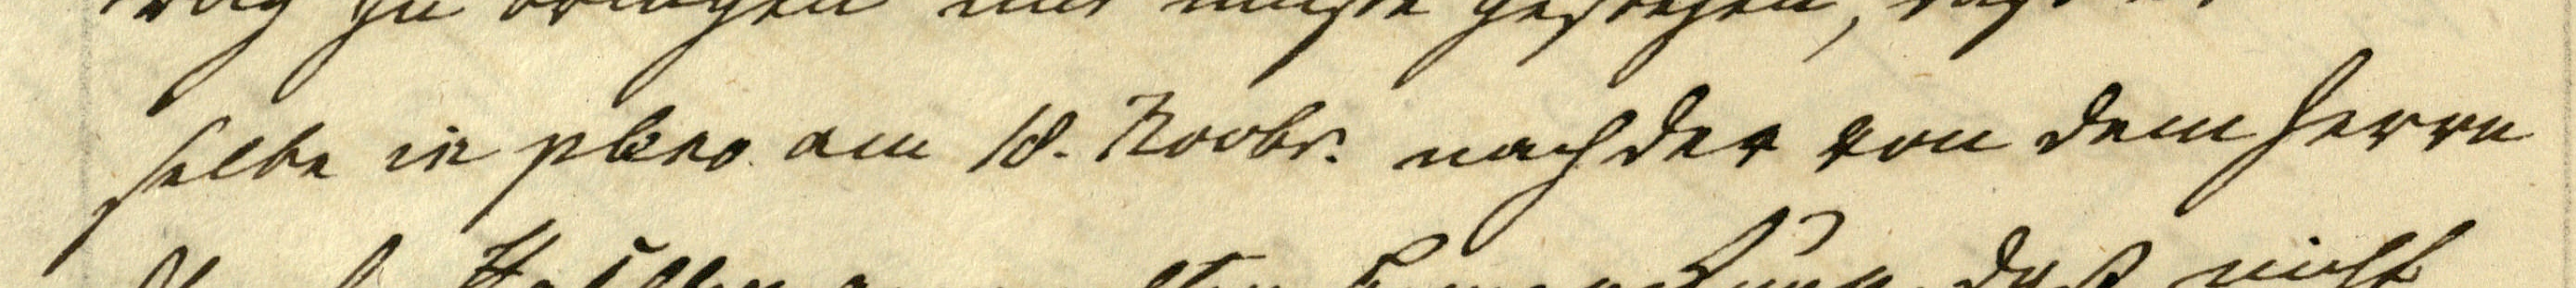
selbe in pleno am 18. Novbr. nach der von dem Herrn
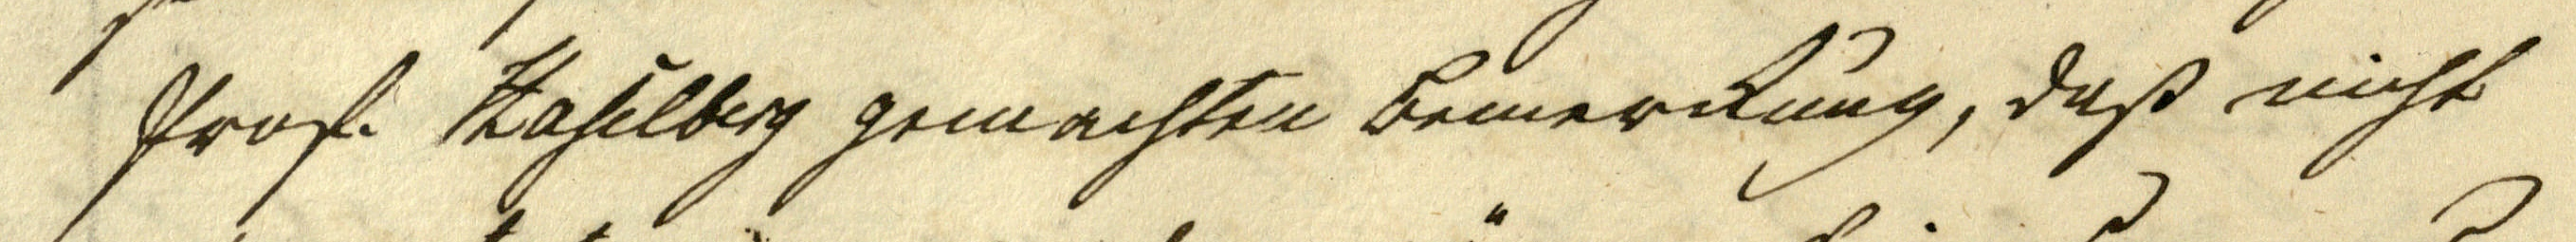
Prof. Haselberg gemachten Bemerckung, daß nicht
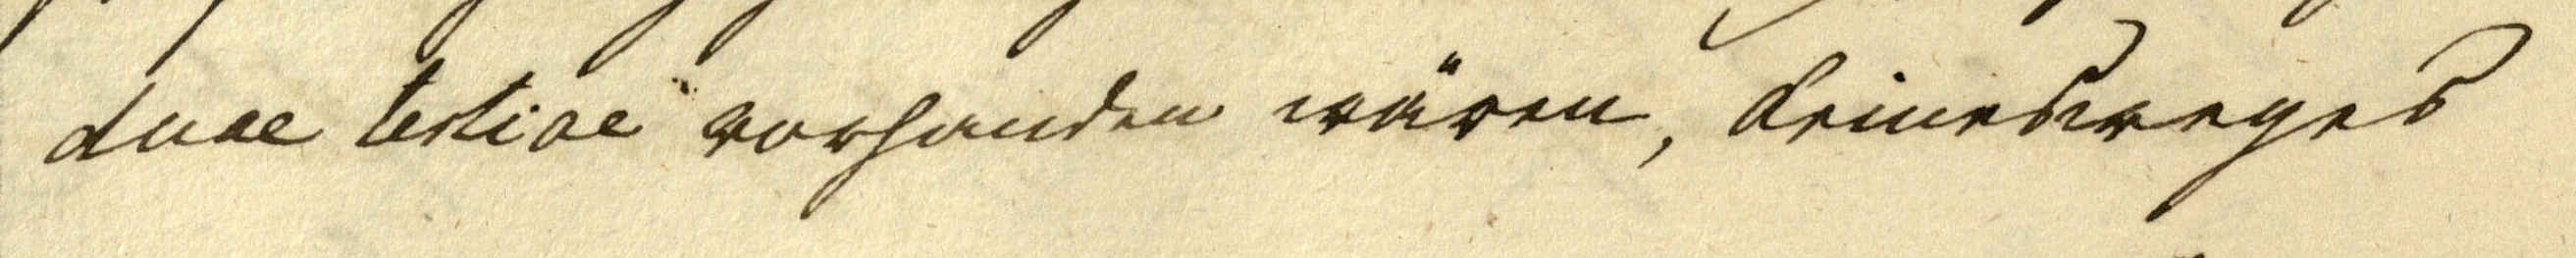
duae tertiae vorhanden wären, keinesweges
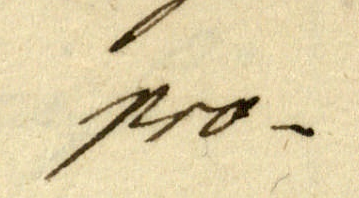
pro-
